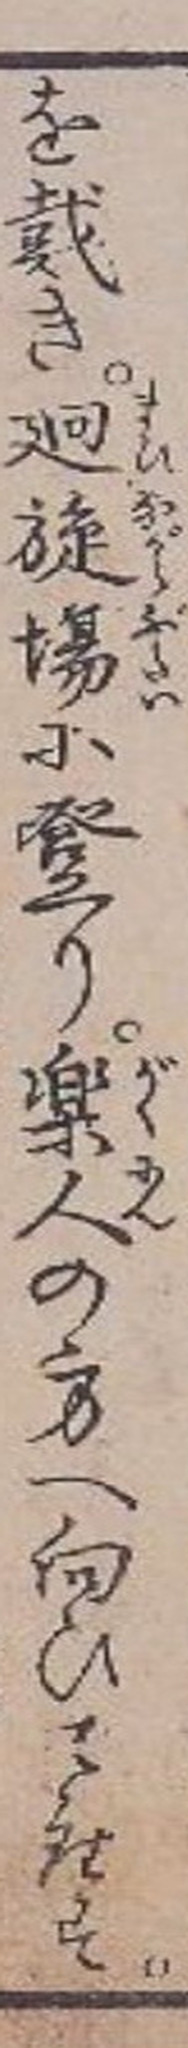を戴き、廻旋場に登り、楽人の方へ向ひて座す、
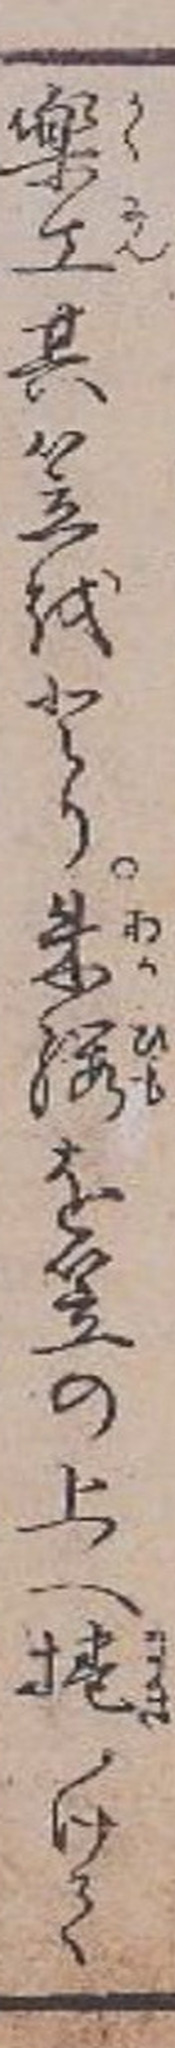楽工其笠をとり、朱纓を笠の上へ捲けて
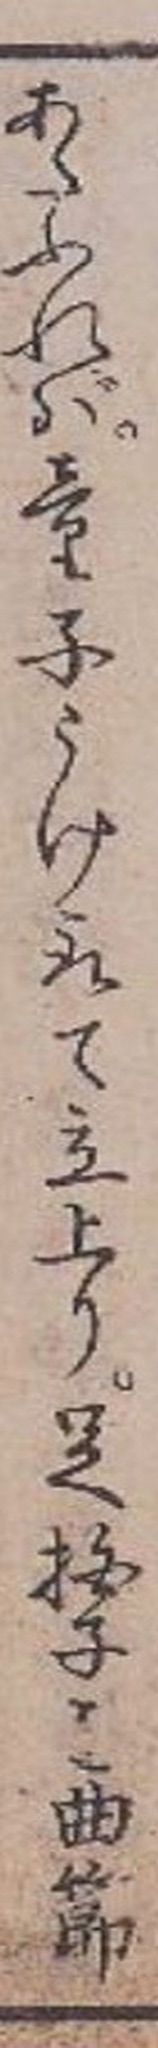あたふれば、童子うけ取て立上り、足拍子を曲節
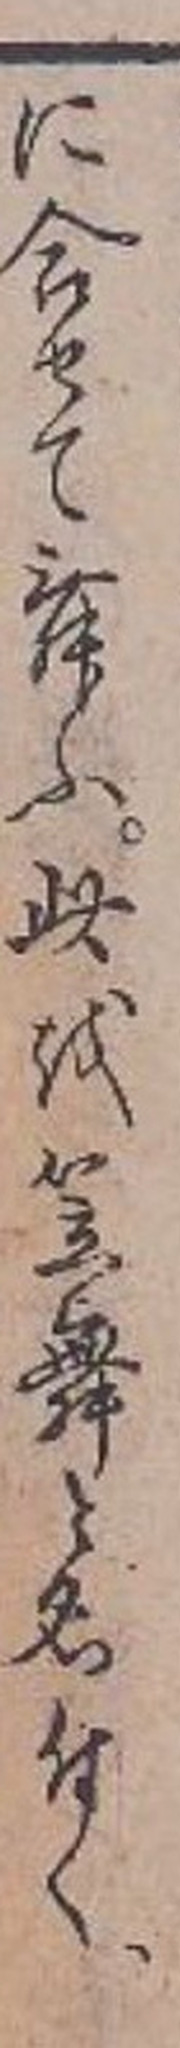に合せて舞ふ、此を笠舞と名付く、

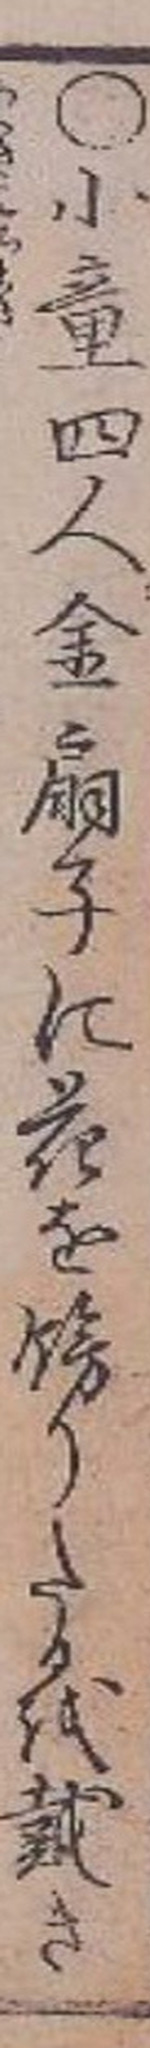〇小童四人、金扇子に花を餝りたるを戴き
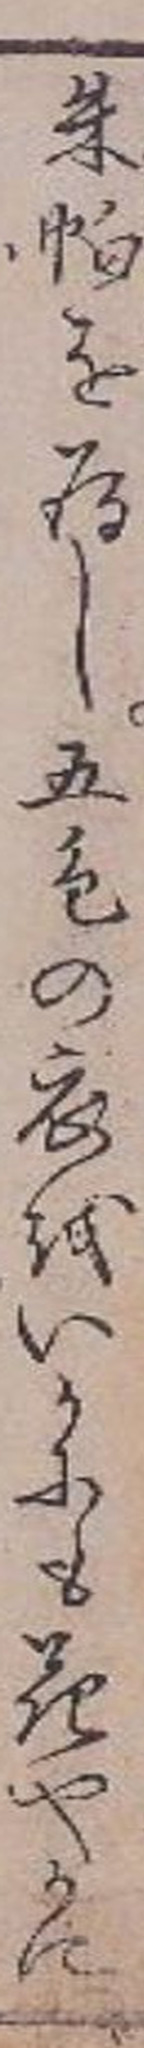朱帕を為し、五色の衣をいかにも花やかに
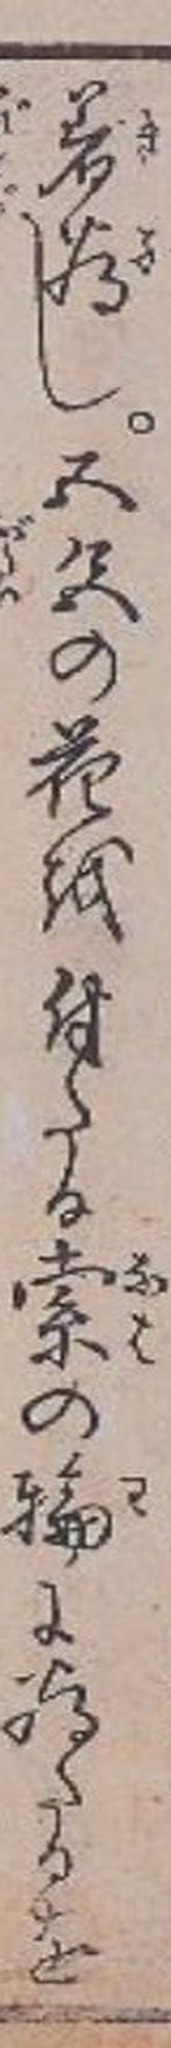着為し、五色の花を付たる索の輪に為たるを
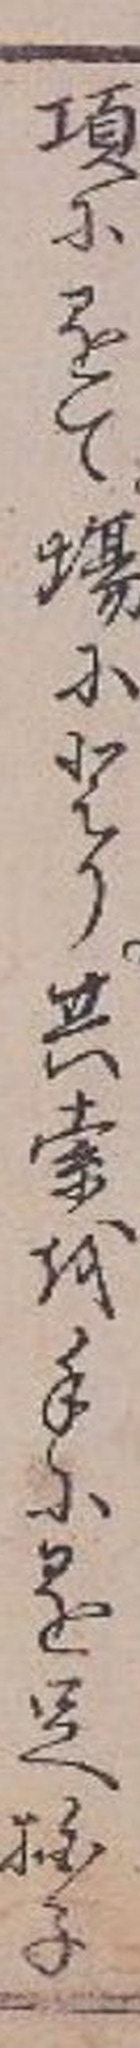頂に懸て、場に登り、其索を手に懸足拍子
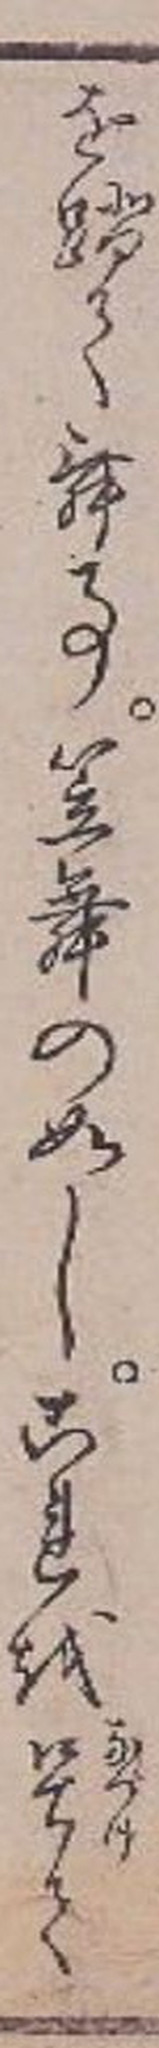を踏て舞事、笠舞の如し、これを号て
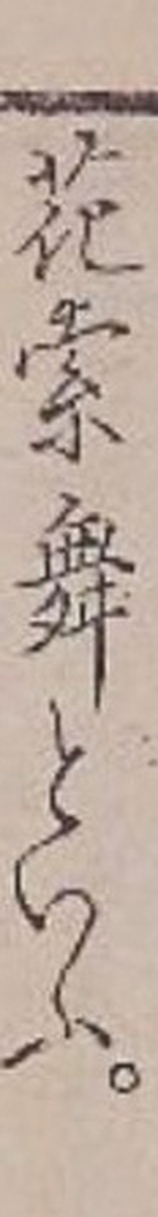花索舞といふ、
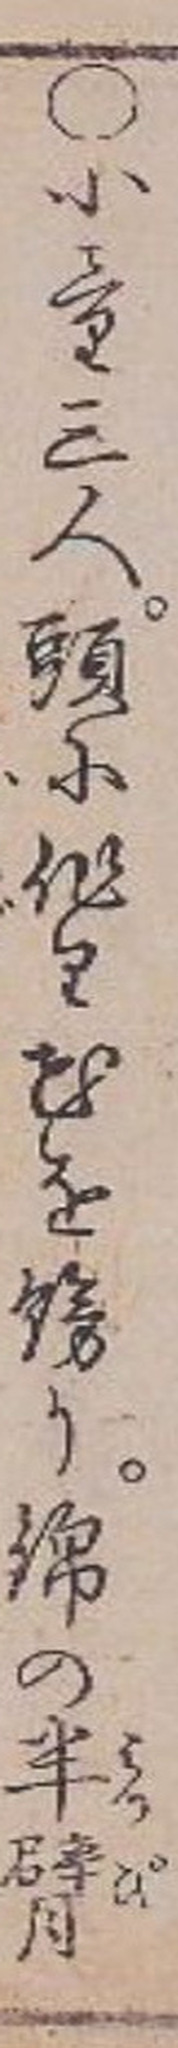〇小童三人、頭に作り花を餝り、錦の半臂
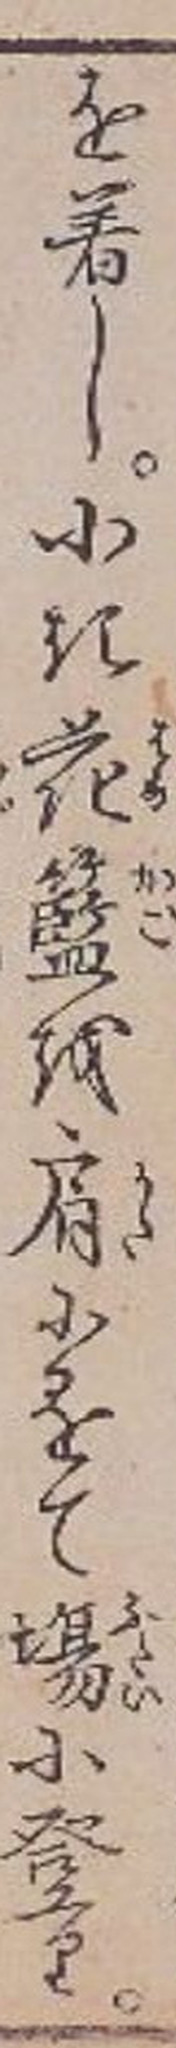を着し、小き花籃を肩に懸て場に登り、
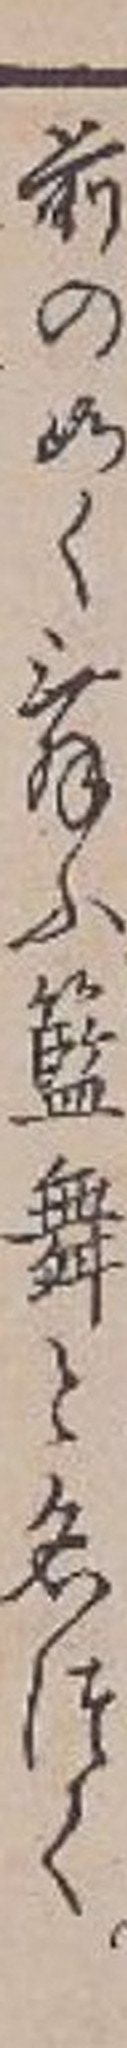前の如く舞ふ、籃舞と名つく、
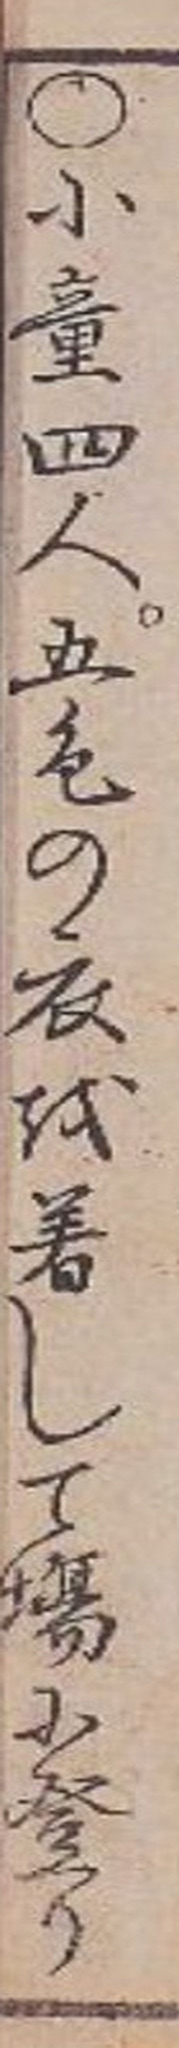〇小童四人、五色の衣を着して場に登り
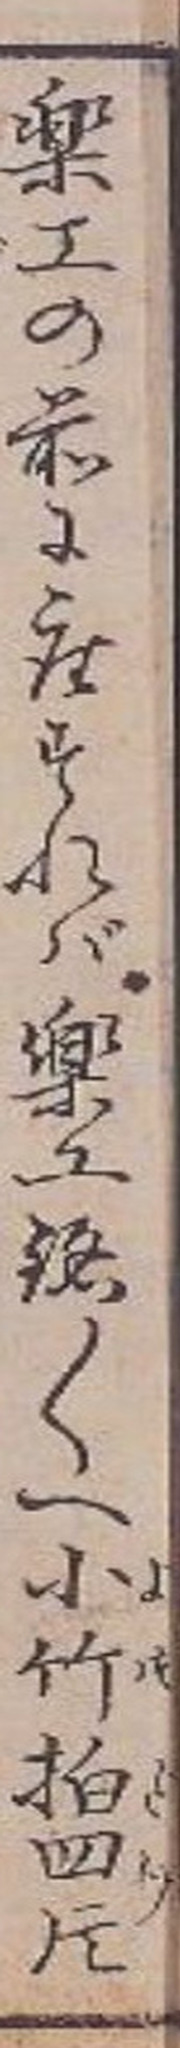楽工の前に座すれば、楽工銘〳〵へ小竹拍四片
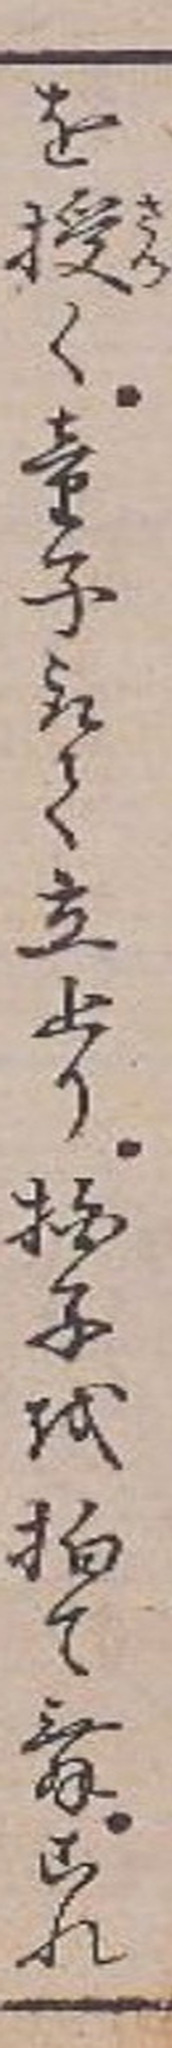を授く、童子取て立上り、拍子を拍て舞、これ
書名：琉球談
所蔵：University of the Ryukyus Library
